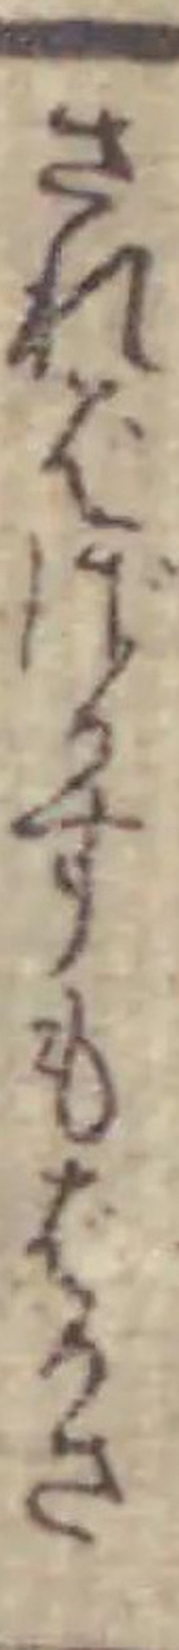さればばかすもばかさ
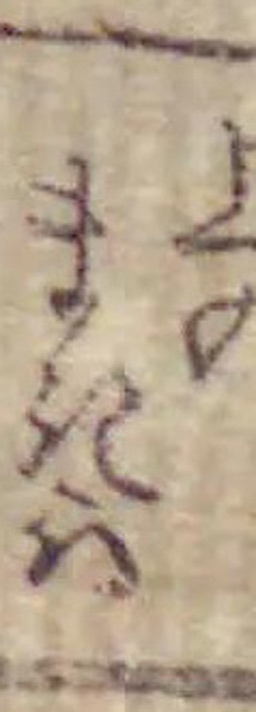まきは
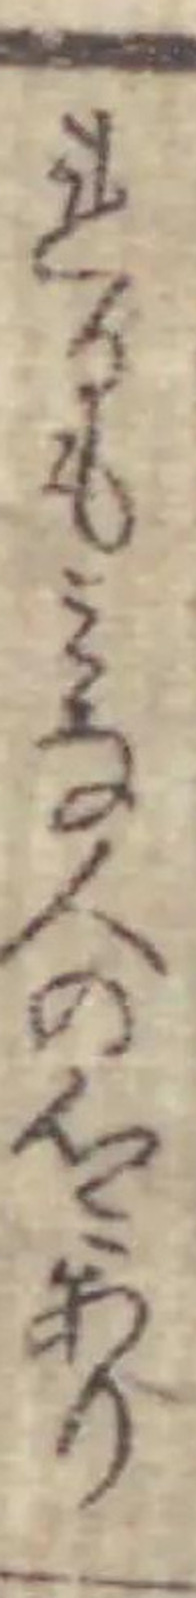れるもみな人の心にあり
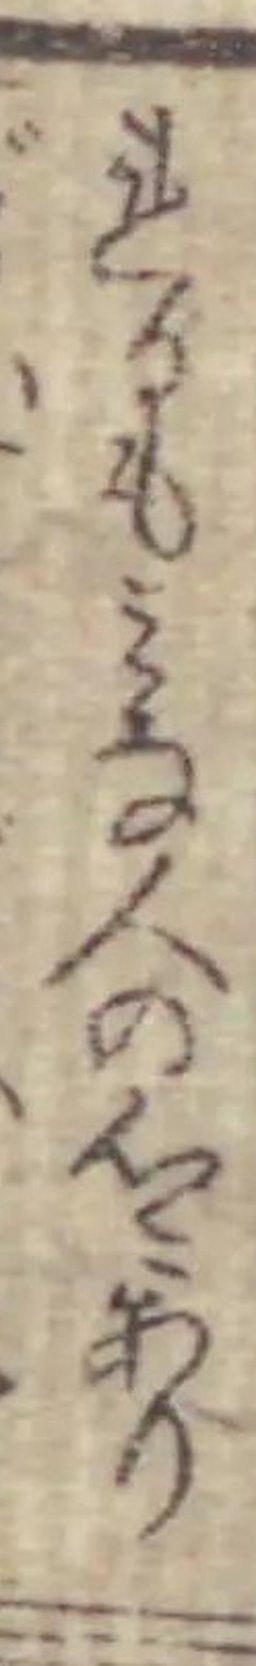れるもみな人の心にあり
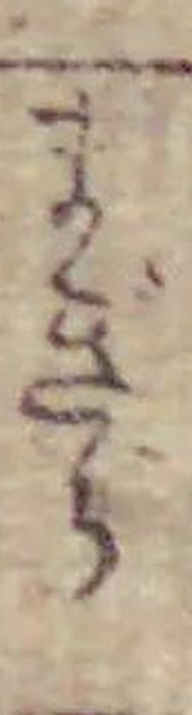まぎら
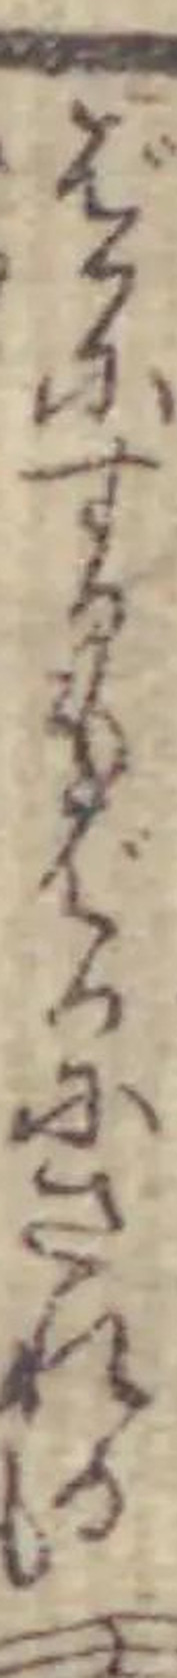ばかにするもばかにされるも
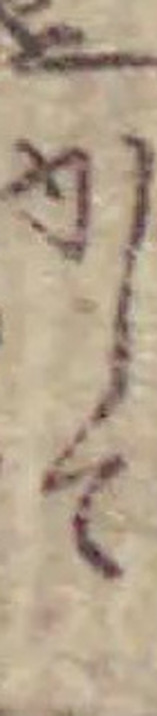かして
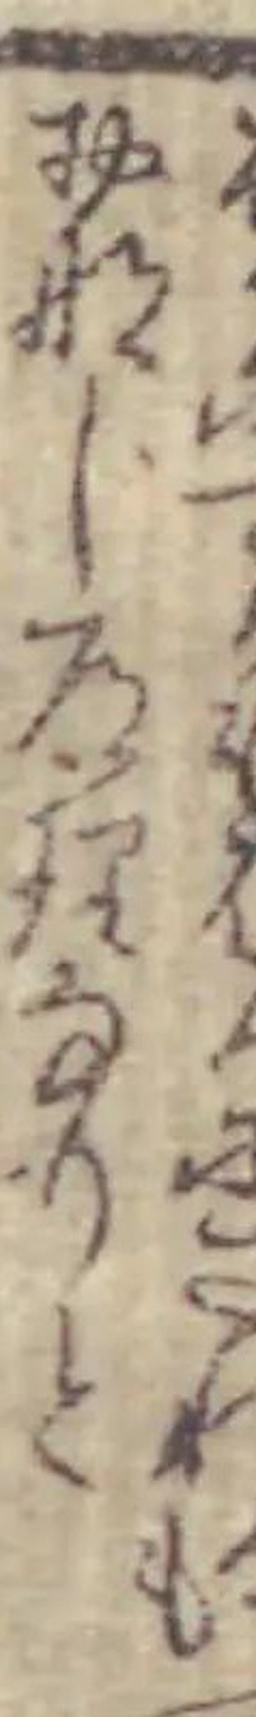おなし道理なりと
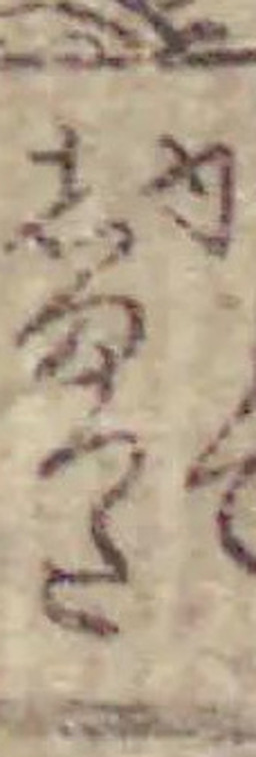しまつた
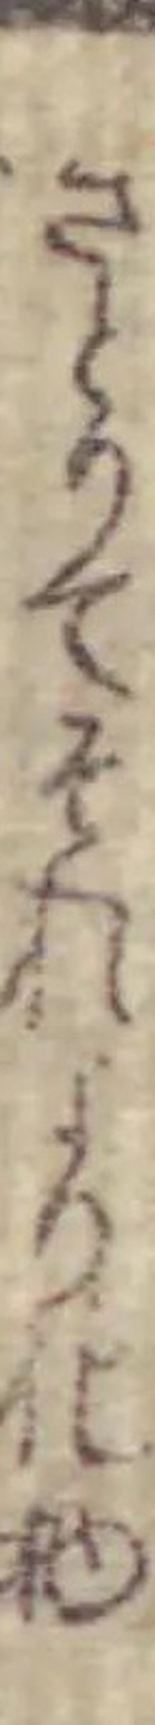さとりてそれより化物
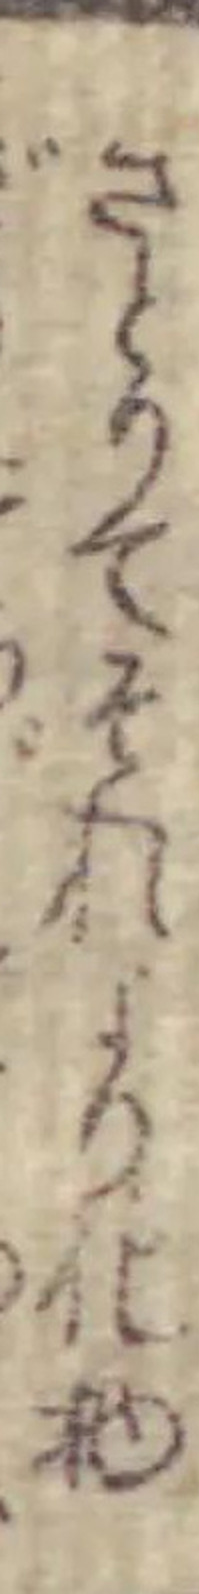さとりてそれより化物
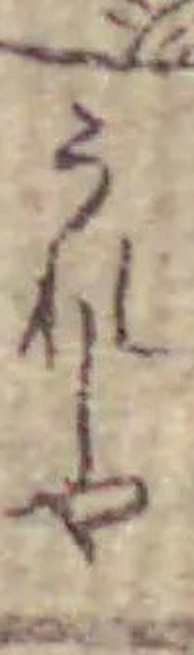うれしや
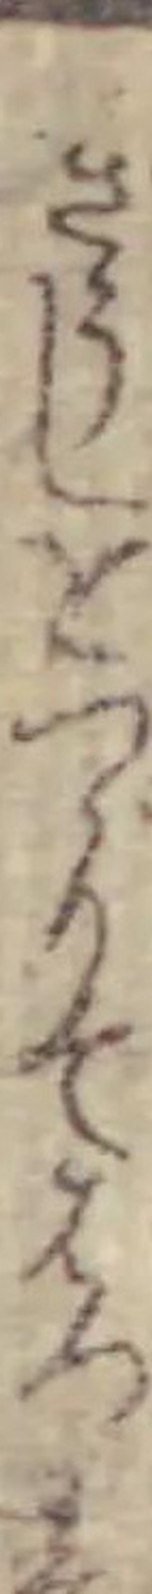ざうしをつゞりてはつ春
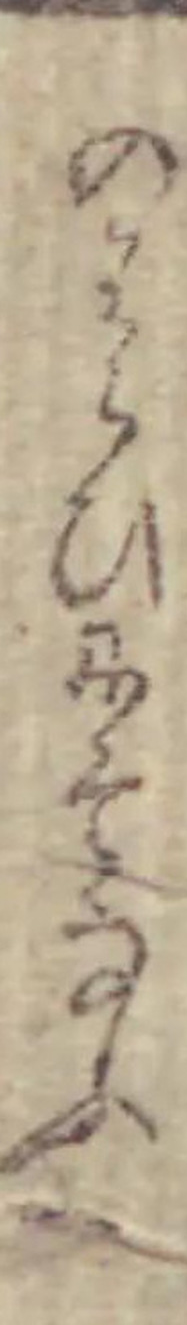のわらひにそなふ
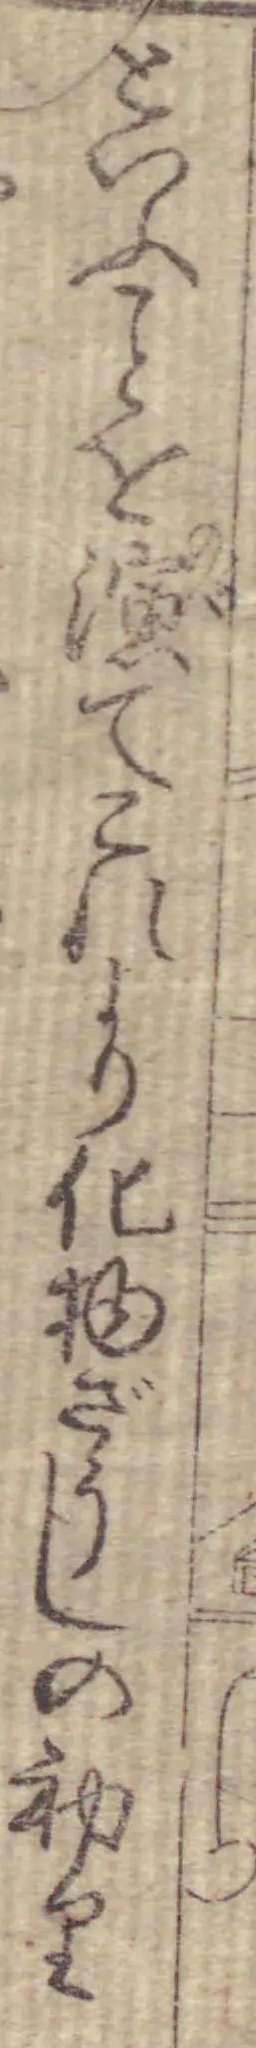といふことを演てこれより化物ざうしの初り
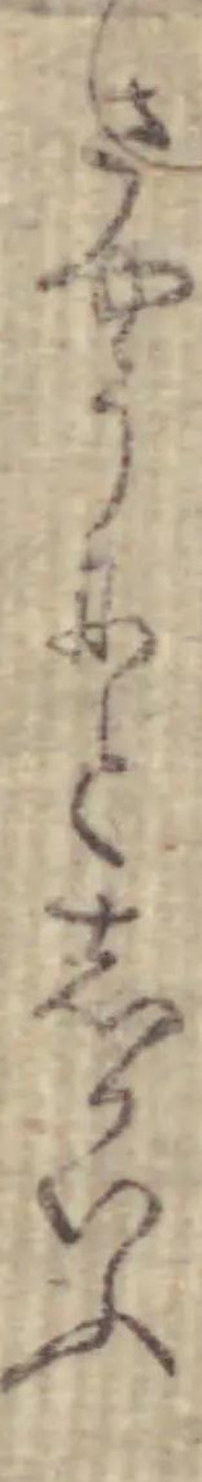さやうにとしかいふ
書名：亀山人家妖 3巻
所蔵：国立国会図書館 National Diet Library, JAPAN
